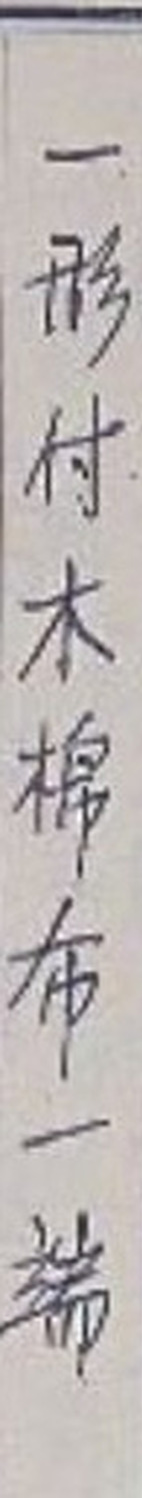一形付木棉布一端
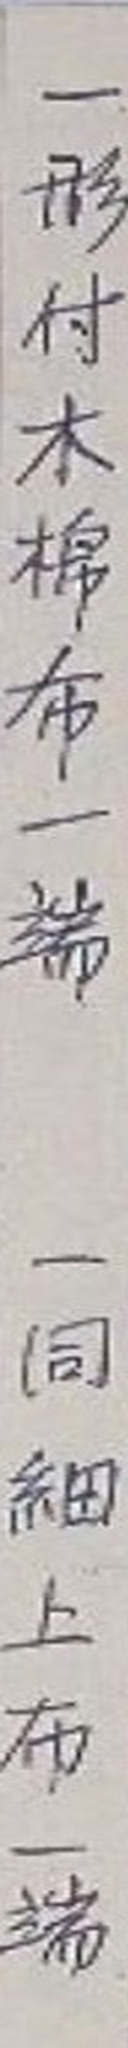一形付木棉布一端一同細上布一端
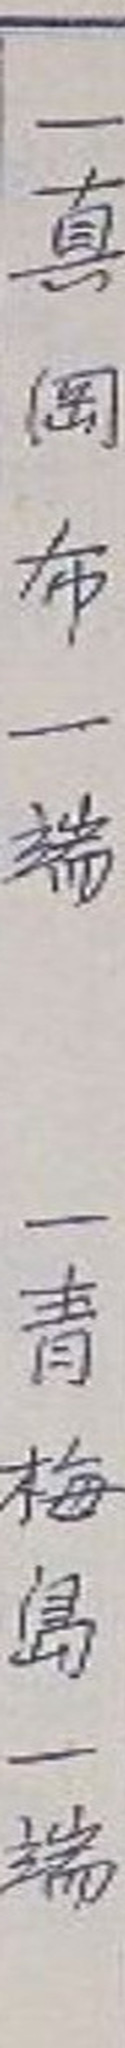一真岡布一端一青梅島一端
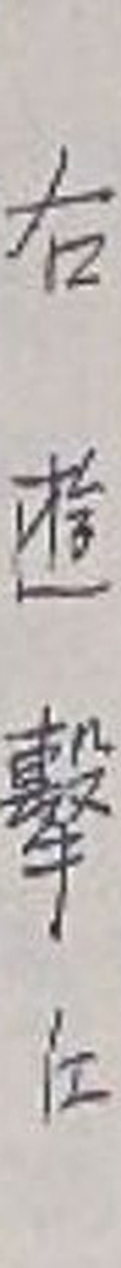右遊撃え
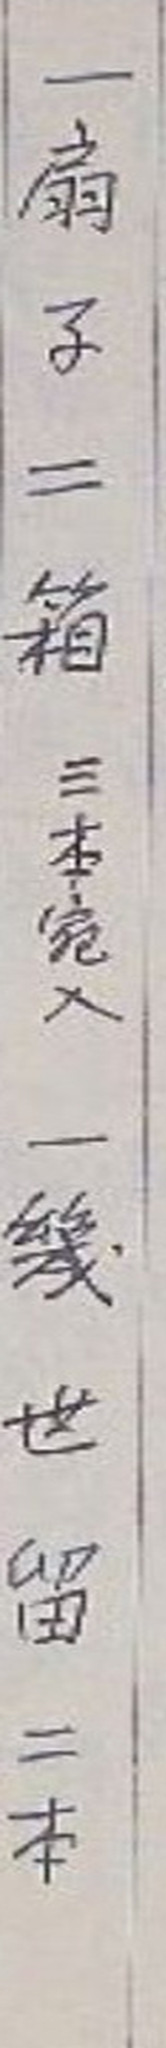一扇子二箱三本宛入一幾世留二本
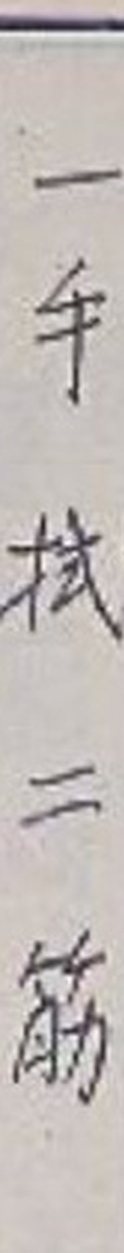一唐紙百枚一手拭二筋
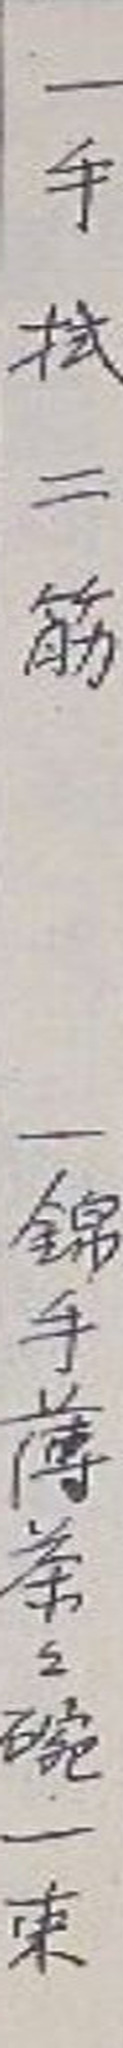一手拭二筋一錦手薄茶々碗一束
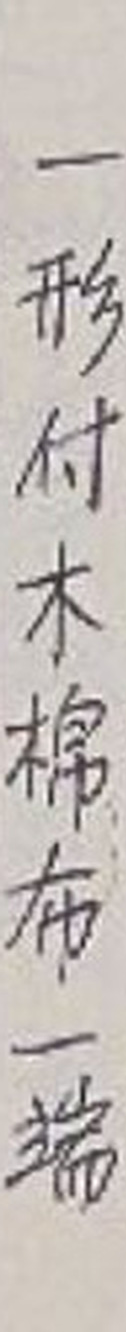一形付木棉布一端
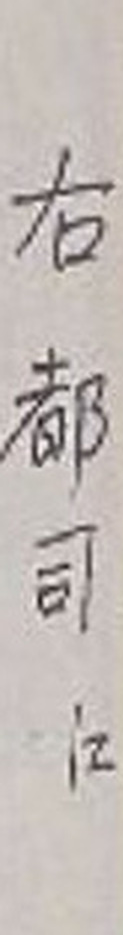右都司え
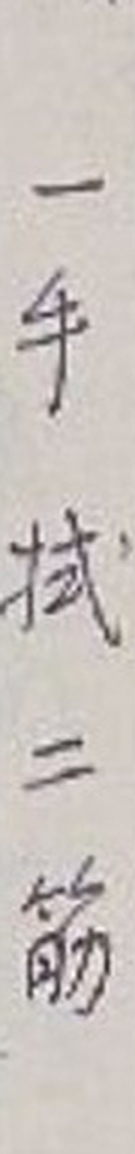一唐紙百枚一手拭二筋
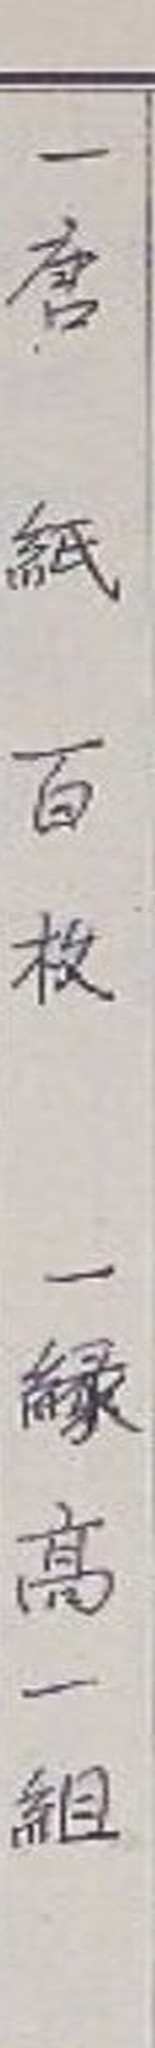一唐紙百枚一縁高一組
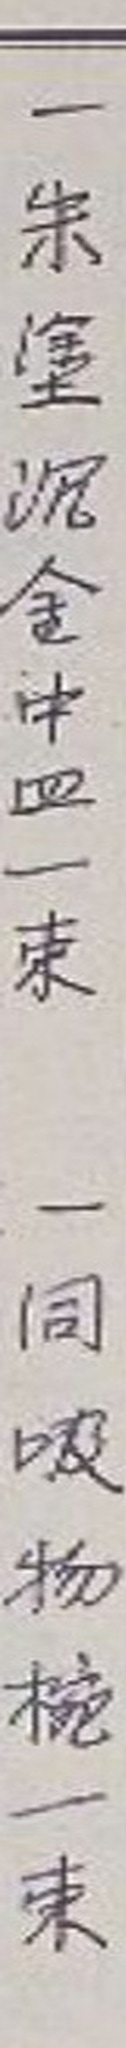一朱塗沈金中皿一束一同吸物椀一束
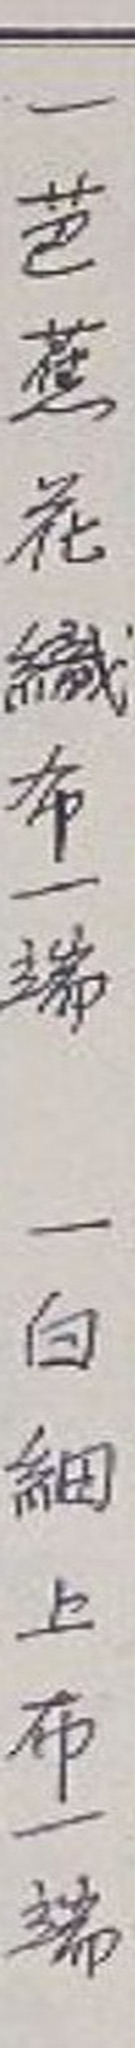一芭蕉花織布一端一白細上布一端
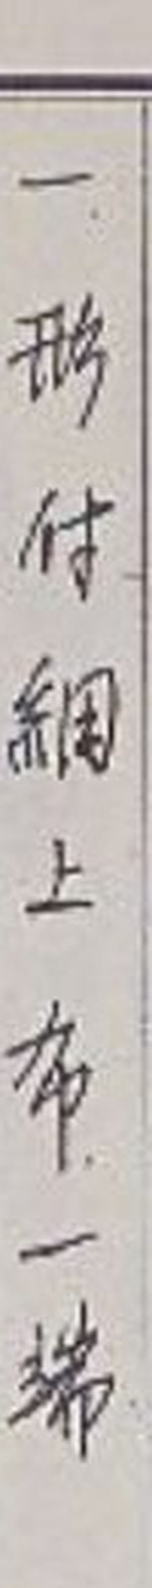一形付木棉布一端
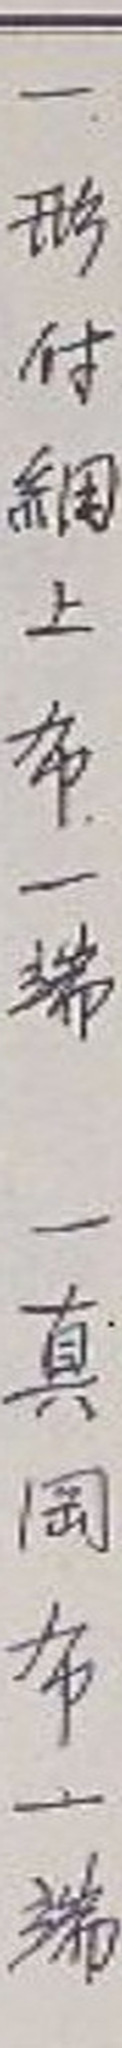一形付細上布一端一真岡布一端
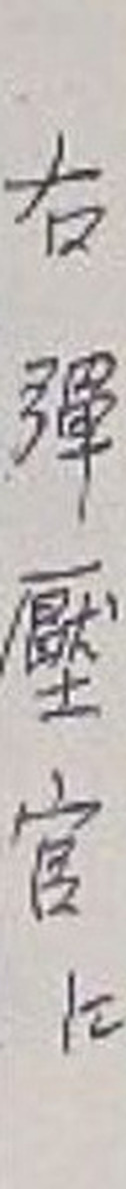右弾圧官え
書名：支那冊封使来琉諸記 下巻
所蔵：University of the Ryukyus Library
